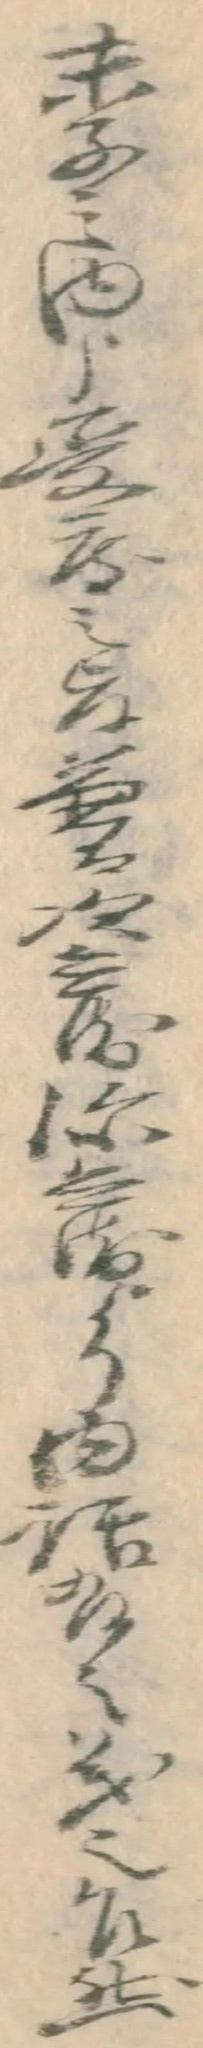未子之内申受度之旨兼而次兵衛弥兵衛より内話有之義也乍然
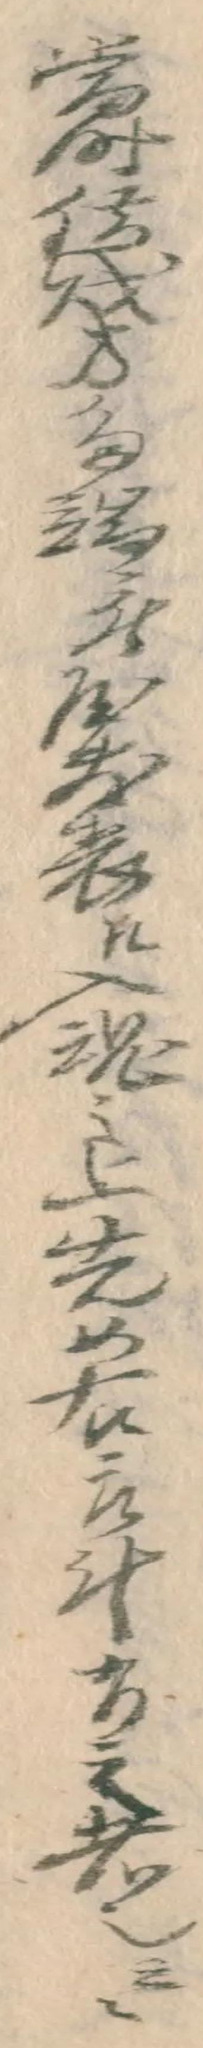當時借財方多端ニ付屋敷表え入魂之上先如右取斗有之者也云々
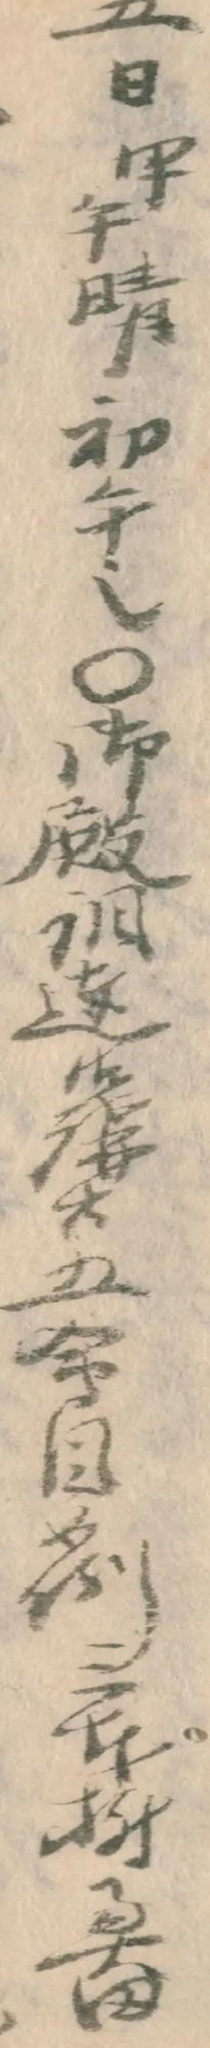五日甲午晴初午也〇御殿調達御講共五會目如例三本樹奥田
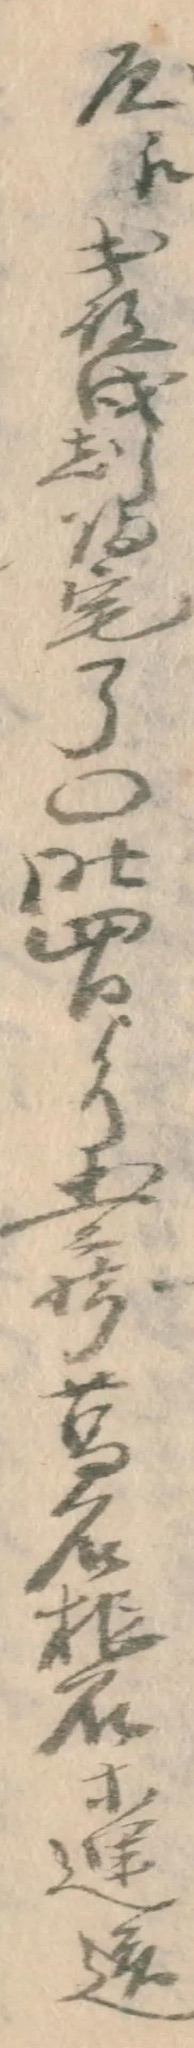屋え出役戌刻帰宅了○昨四日より玉兵衛葛名根石等運送
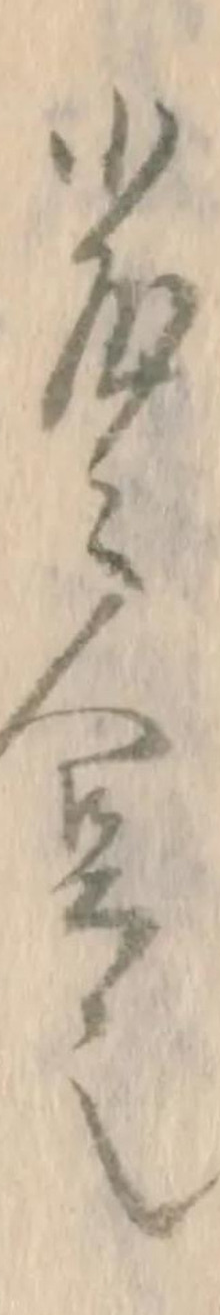小屋之人足也
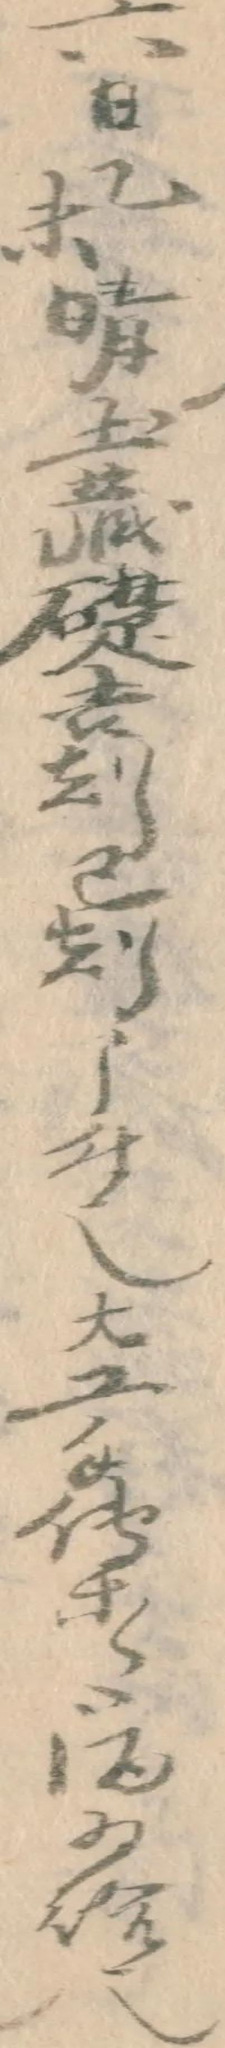六日乙未晴土蔵礎吉刻巳刻申付也大工手傳等御酒為給也
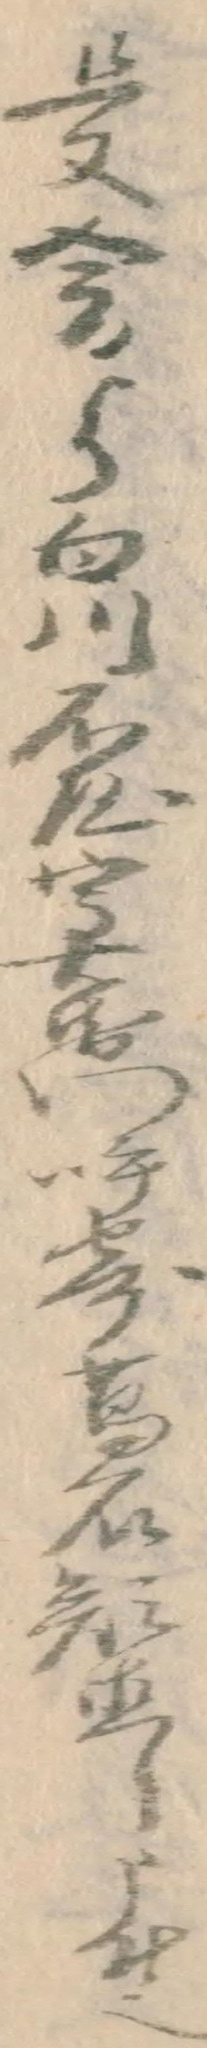且又今日より白川石屋宇右衛門呼寄葛名類直し申付也
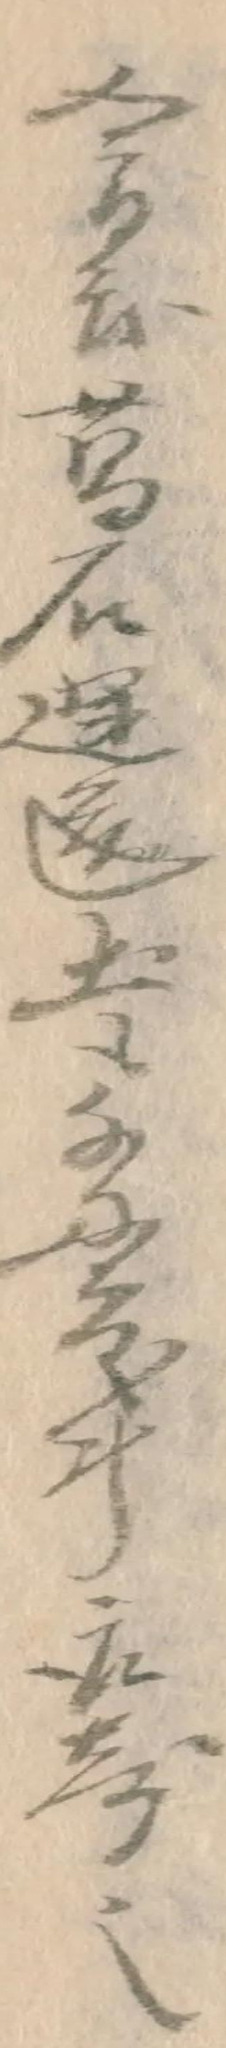今日も葛石運送出も千貫斗取締也
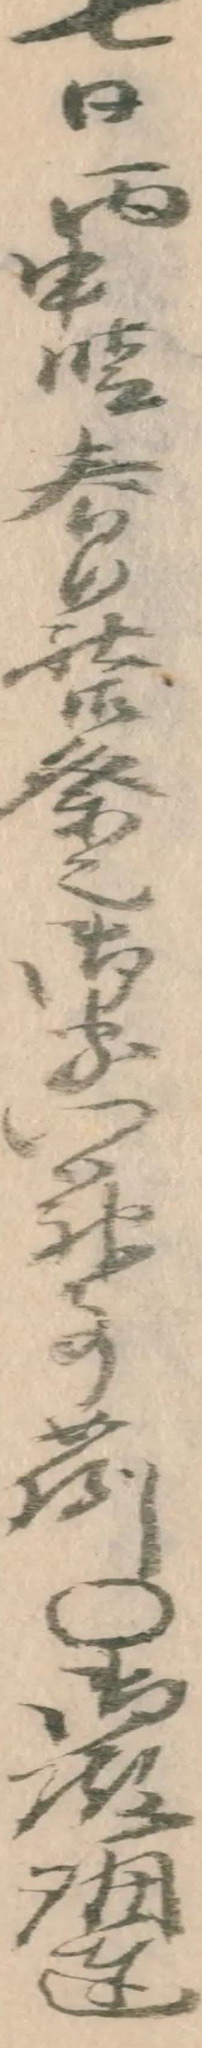七日丙申晴春日社御祭也御家門御神事如例〇御殿調達
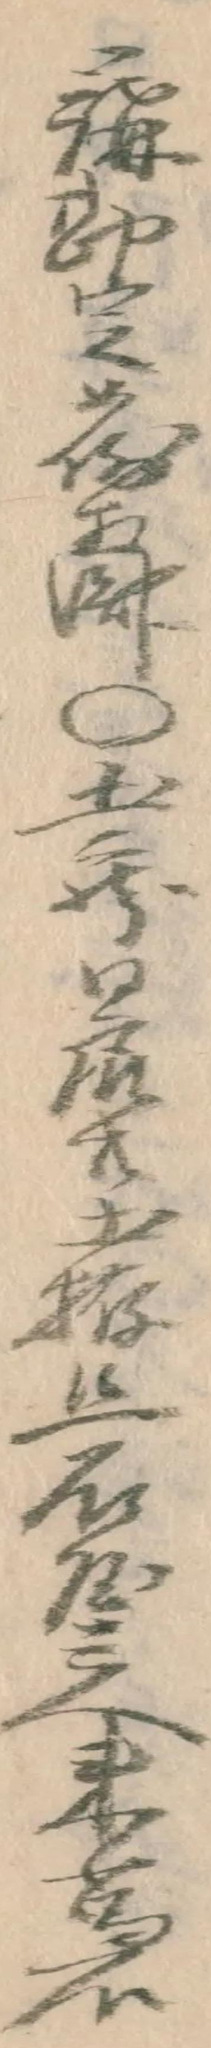御講勘定如例相済〇土蔵日雇共土拵且石屋三人来葛石
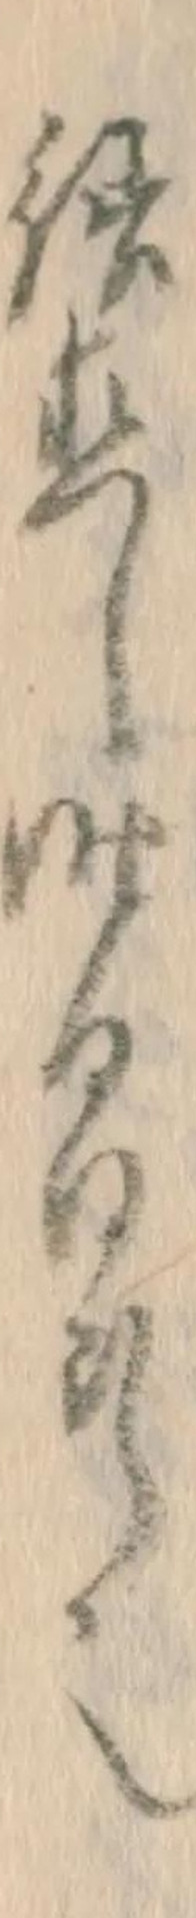繕直し昨日同断也
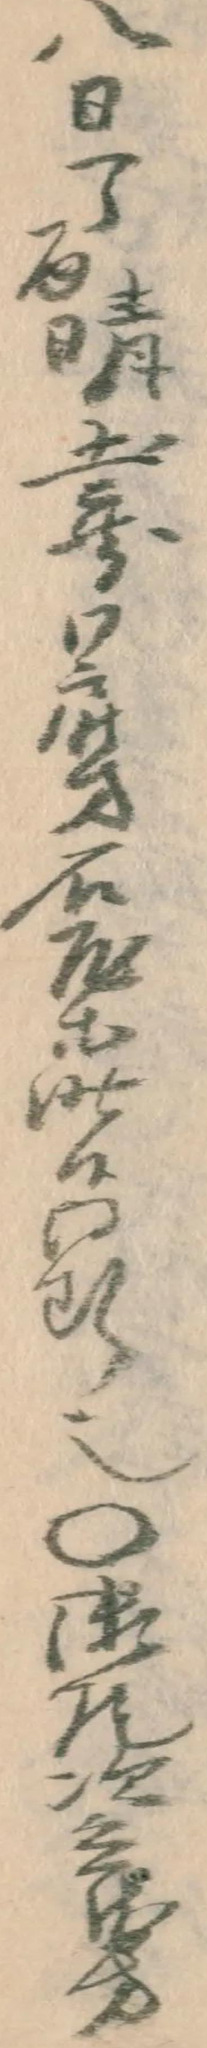八日丁酉晴土蔵日雇方石屋等昨日同断也○瀬尾次兵衛方
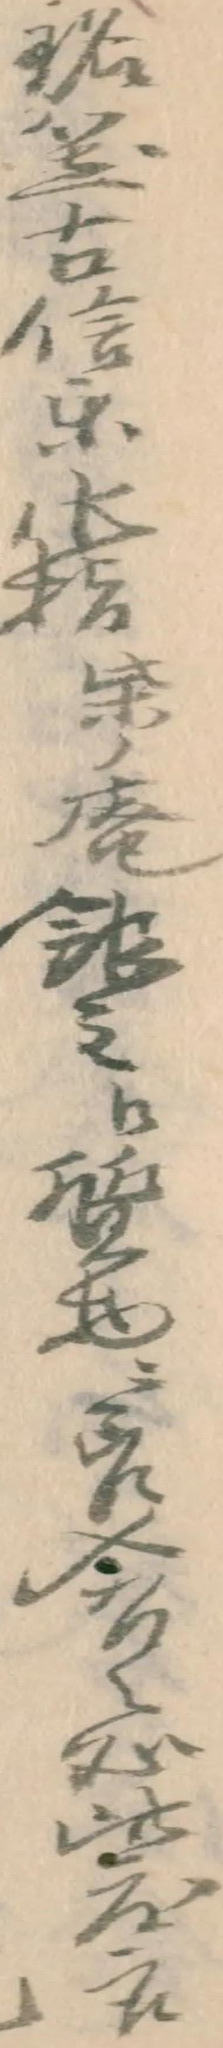銘蓋古信楽水指果ノ焼飽之え質物ニ差合之処此度取
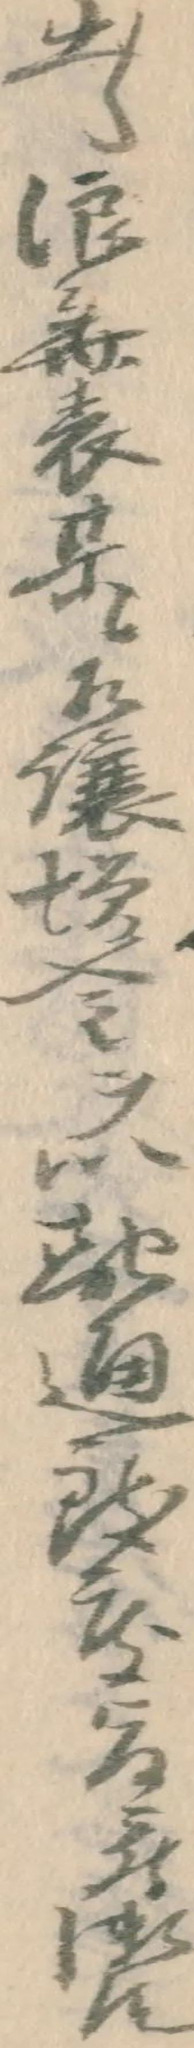出候浪斎表某え相譲増金ヲ以融通致度旨ニ付瀬尾
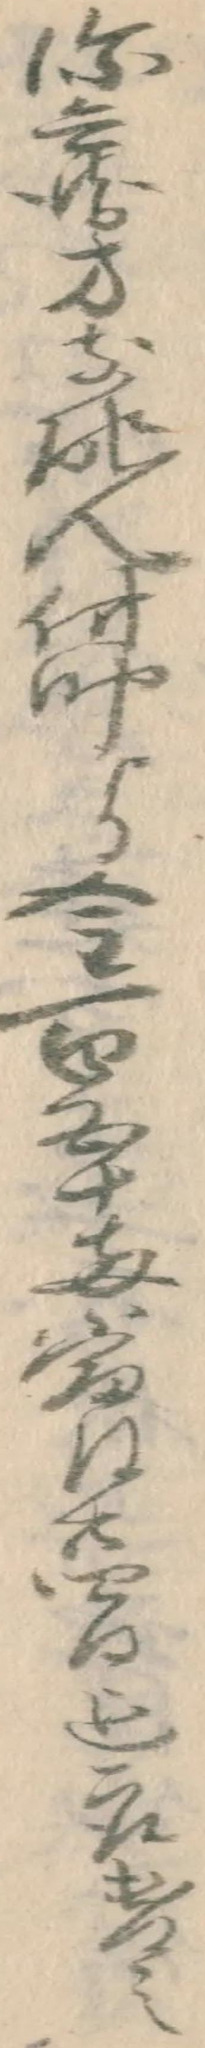弥兵衛方支配人供助より金百五十両当月廿四日迄取替之
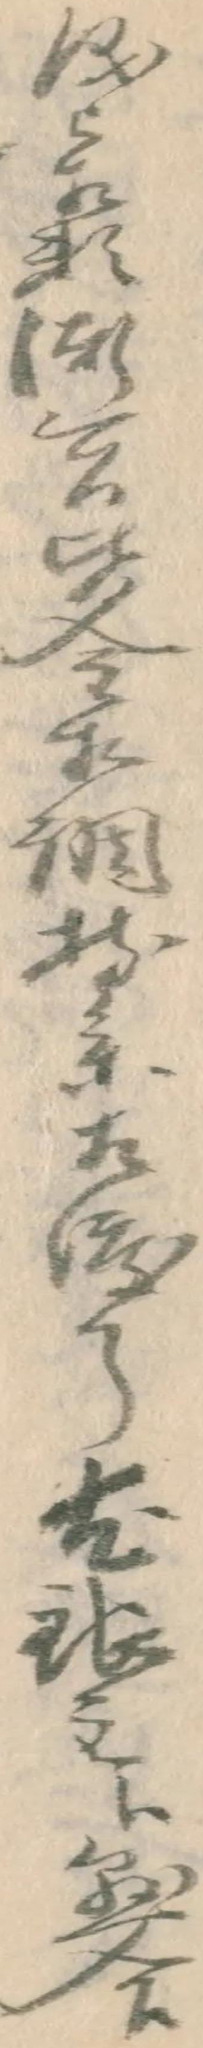儀被御頼漸今日皆令相調持参相渡了尤銀主え懸合
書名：賀茂社記録. 第67冊
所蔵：国立国会図書館 National Diet Library, JAPAN
